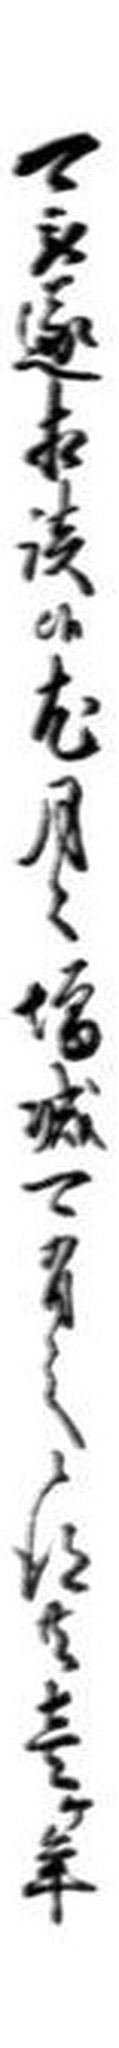可被遂相談候尤月々増減可有之候得共壱ヶ年
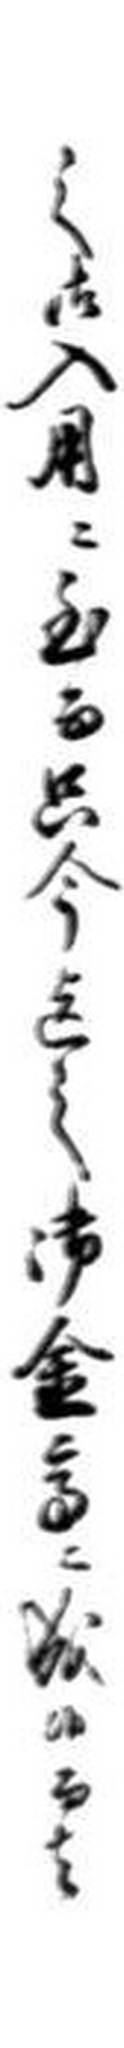之御入用ニ至而只今迄之御金高ニ成候而者
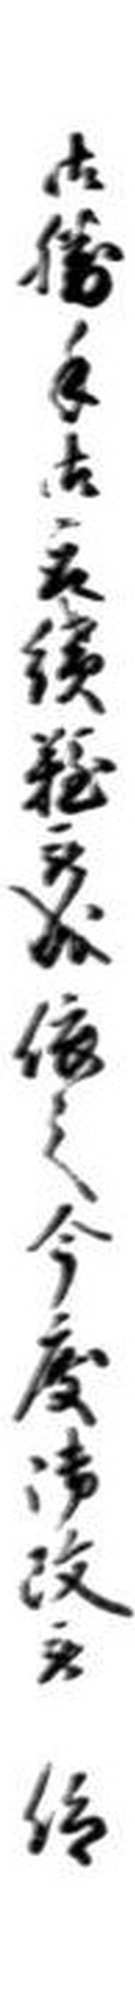御勝手御取続難被成依之今度御改被仰
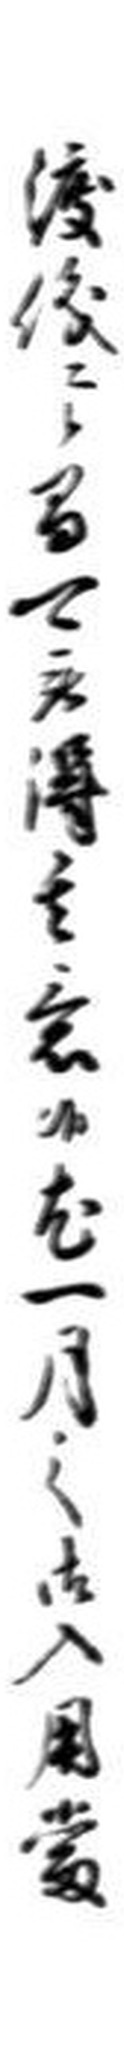渡儀ニ候間可被得其意候尤一月之御入用当
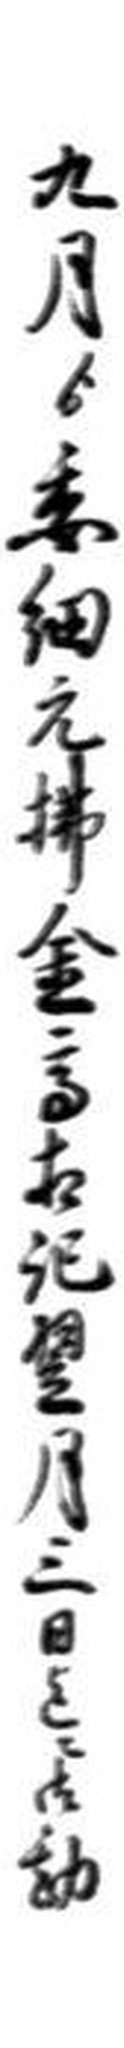九月ゟ委細元払金高相記翌月三日迄ニ御勘
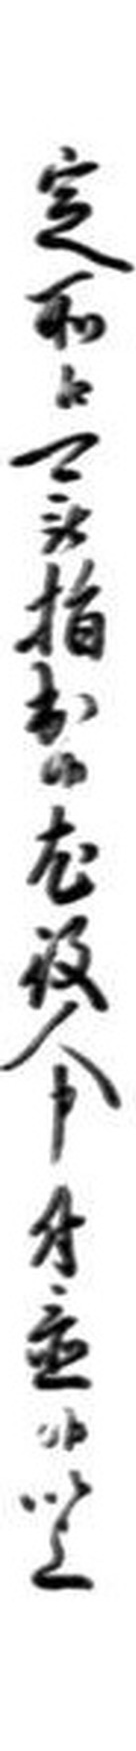定所江可被指出候尤役人中も申付置候以上
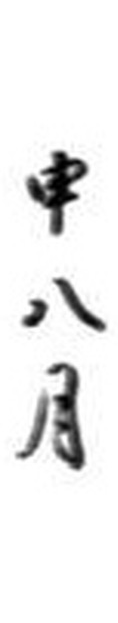申八月
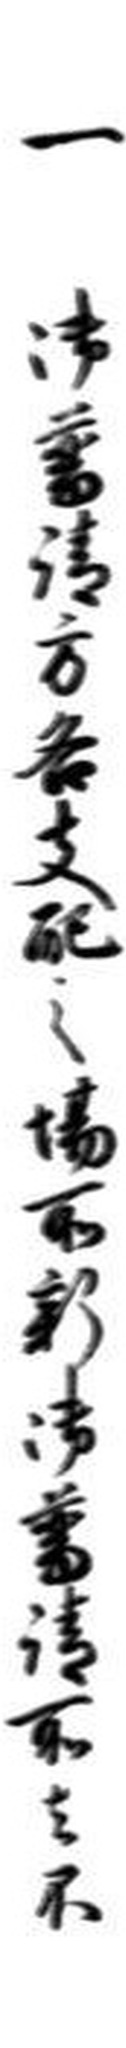一御普請方各支配之場所新御普請所者不

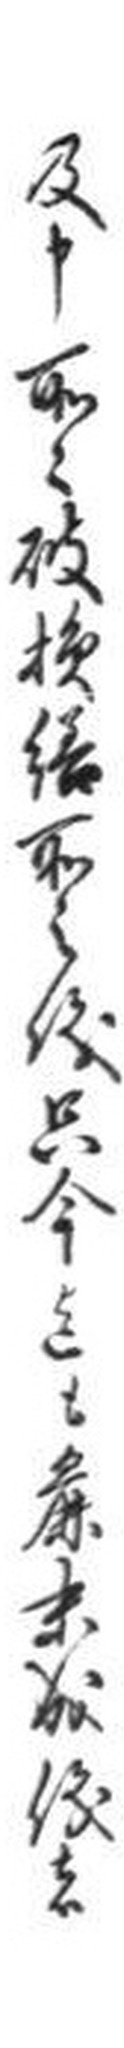及申所々破損繕所之儀只今迄も麁末成儀者
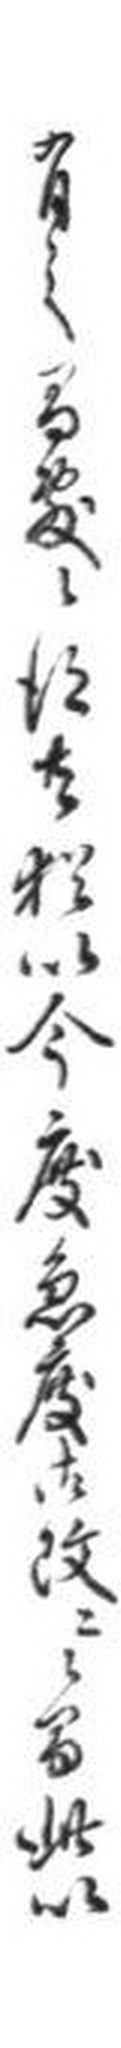有之間敷候得共猶以て今度急度御改ニ候間此以
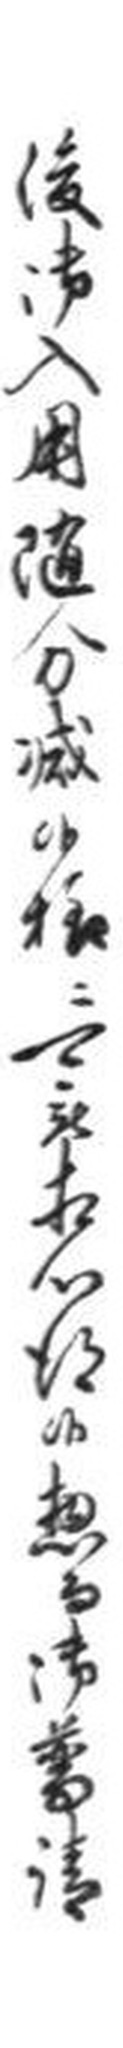後御入用随分減候様ニ可被相心得候惣而御普請
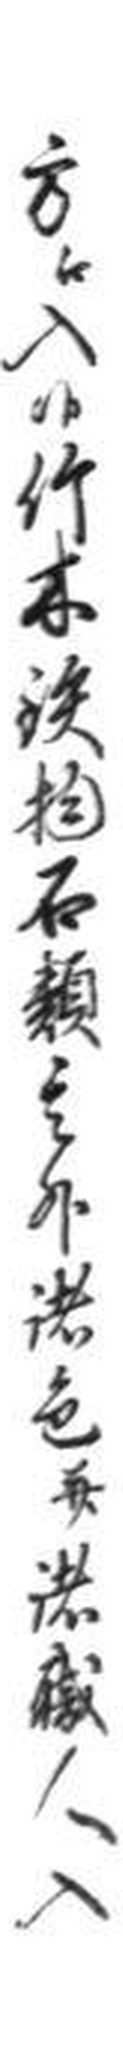方江入候竹木鉄物石類其外諸色并諸職人入
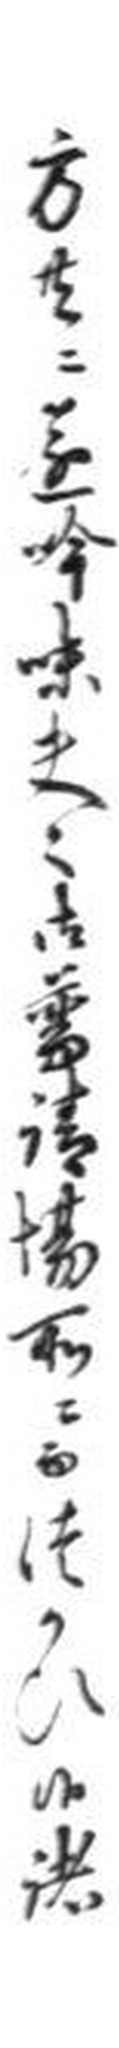方共ニ遂吟味夫々御普請場所ニ而つかひ候諸
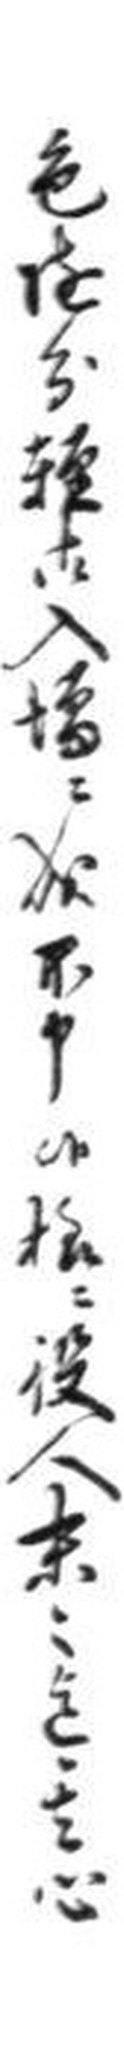色随分軽御入増ニ成不申候様ニ役人末々迄其心
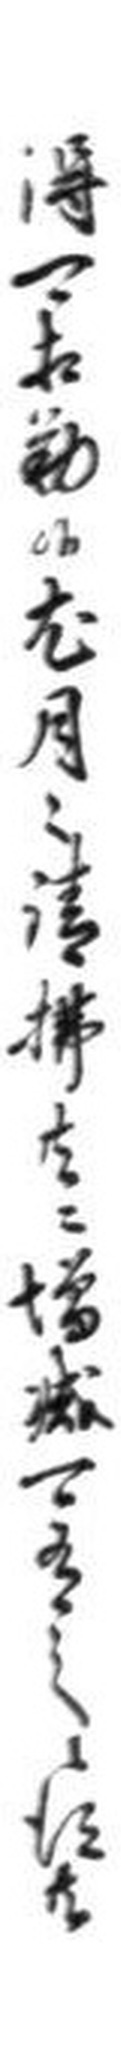得可相勤候尤月々請払ニ増減可有之候得共
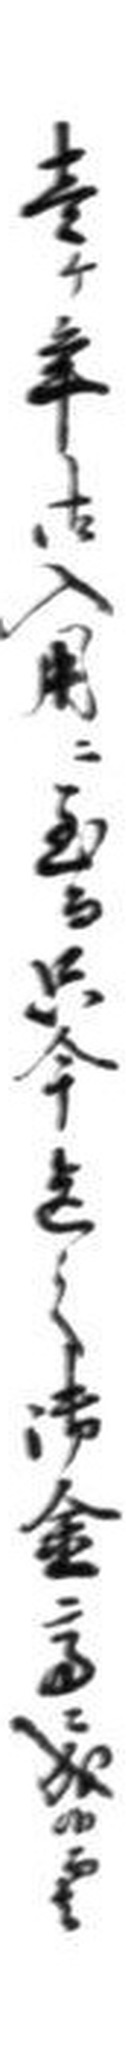壱ヶ年御入用ニ至而只今迄之御金高ニ成候而者
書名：家譜 三十一 吉邦公 享保元年
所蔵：福井県文書館 Fukui Prefectural Archives
